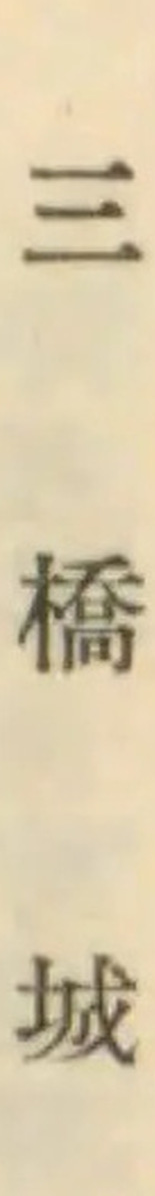三橋城
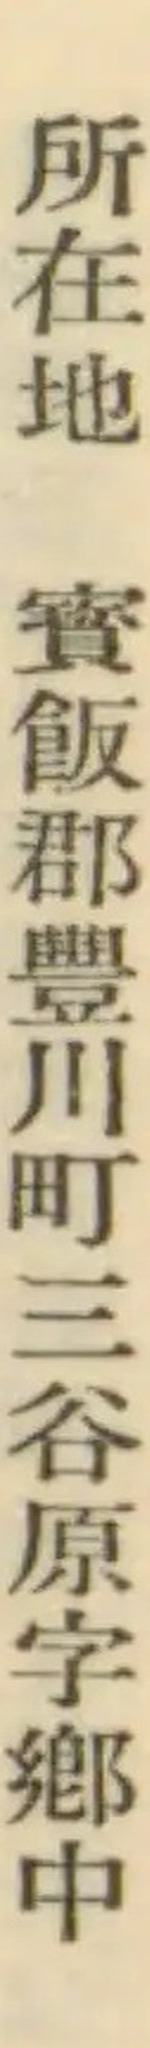所在地宝飯郡豊川町三谷原字郷中
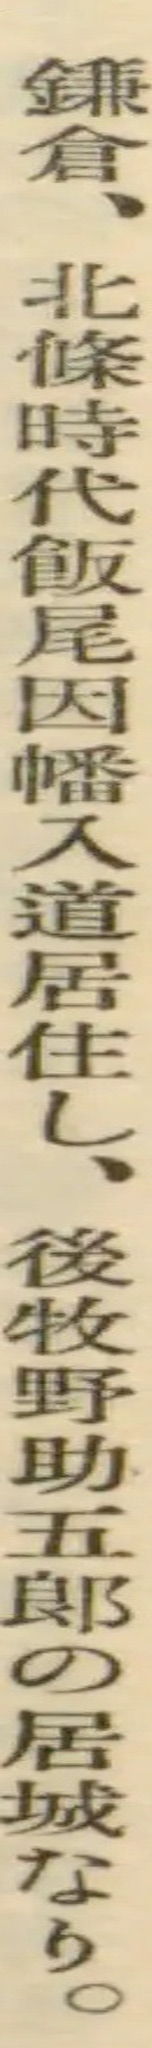鎌倉、北條時代飯尾因幡入道居住し、後牧野助五郎の居城なり。
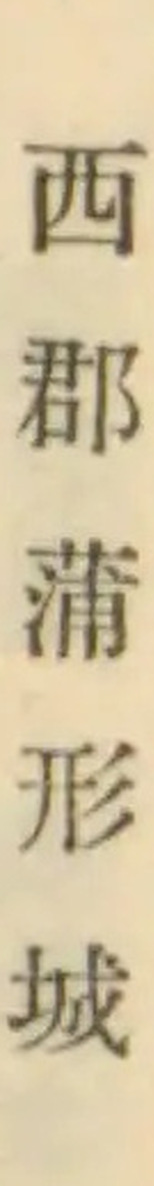西郡蒲形城

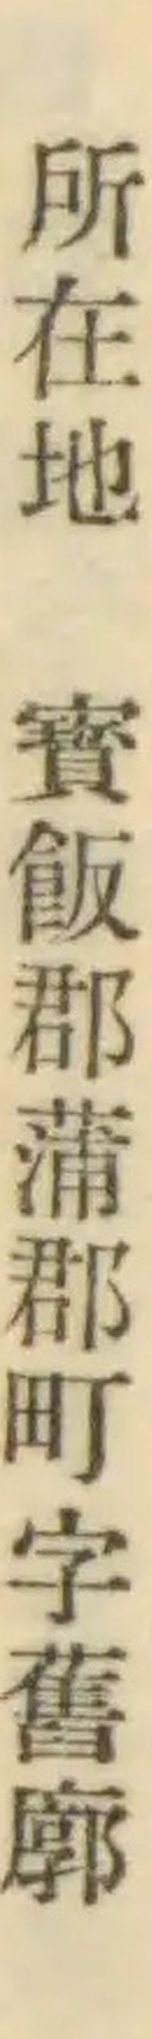所在地宝飯郡蒲郡町字旧廓
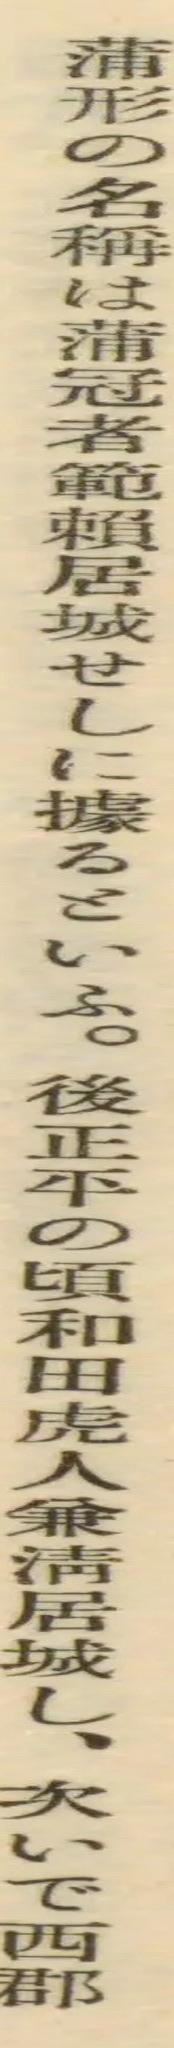蒲形の名称は蒲冠者範頼居城せしに拠るといふ。後正平の頃和田虎人兼清居城し、次いで西郡
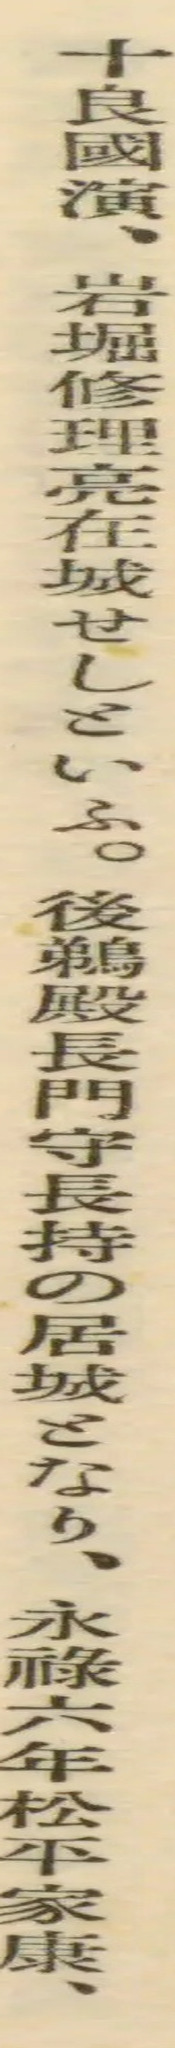十良国演、岩堀修理亮在城せしといふ。後鵜殿長門守長持の居城となり、永禄六年松平家康、
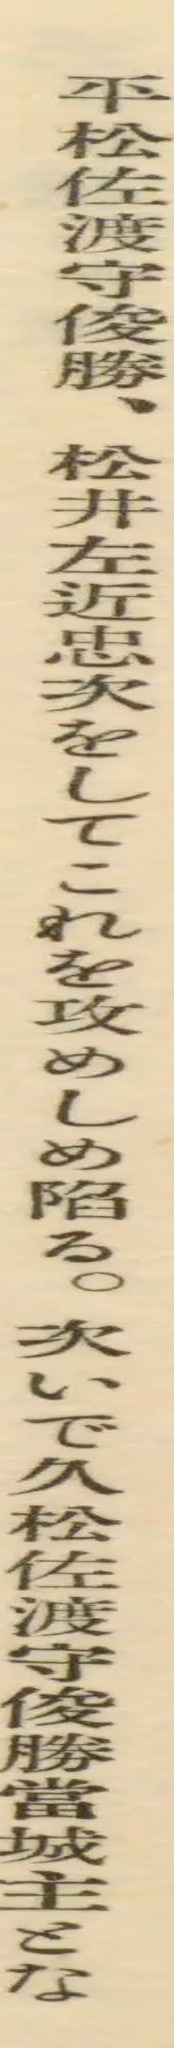平松佐渡守俊勝、松井左近忠次をしてこれを攻めしめ陥る。次いで久松佐渡守俊勝当城主とな
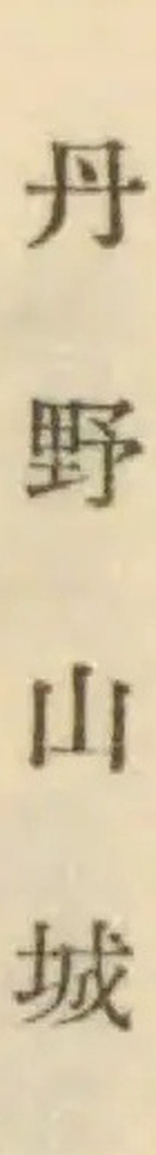丹野山城
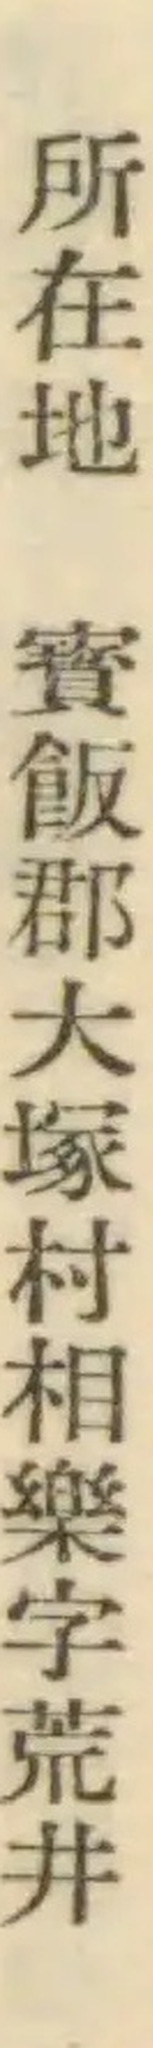所在地宝飯郡大塚村相楽字荒井
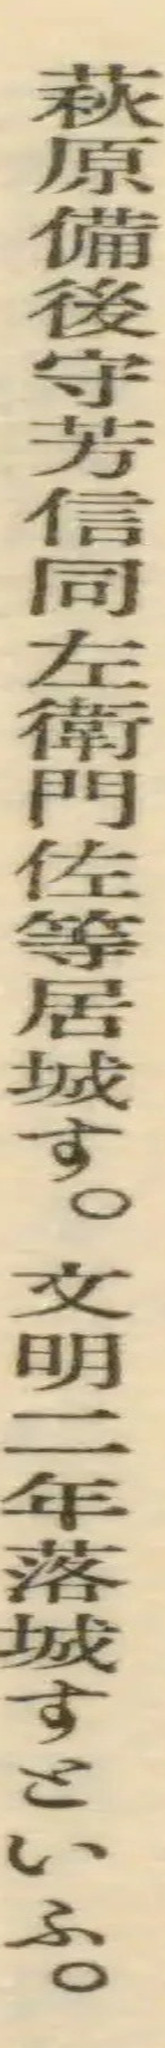萩原備後守芳信同左衛門佐等居城す。文明二年落城すといふ。
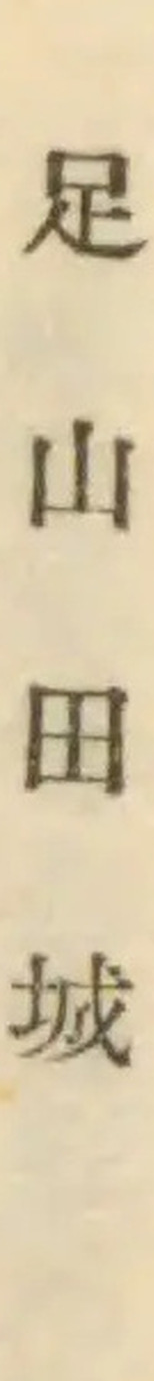足山田城
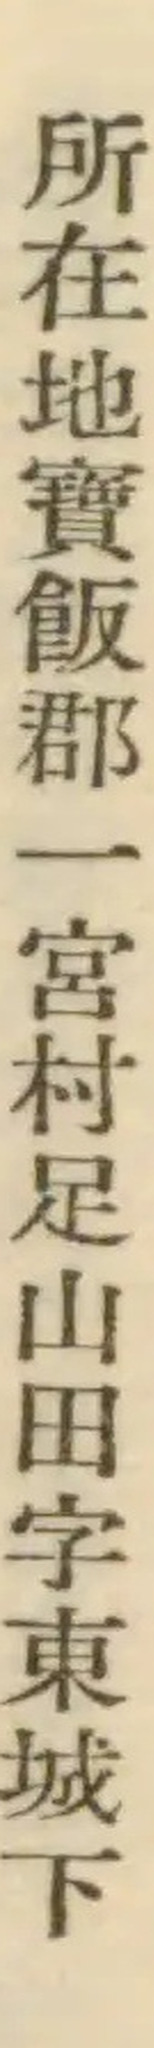所在地宝飯郡一宮村足山田字東城下
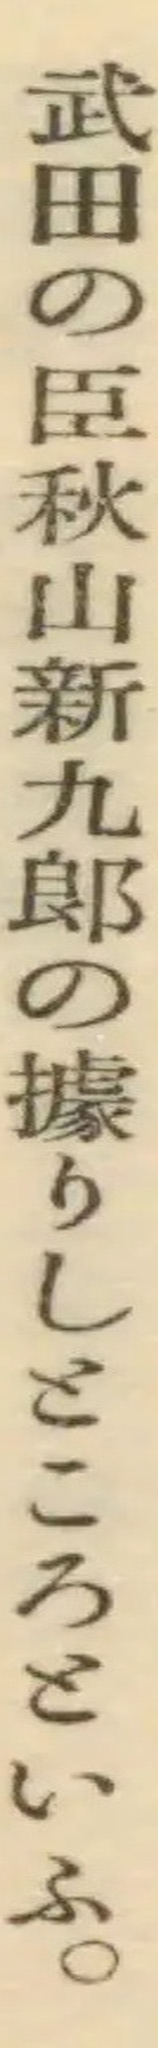武田の臣秋山新九郎の拠りしところといふ。
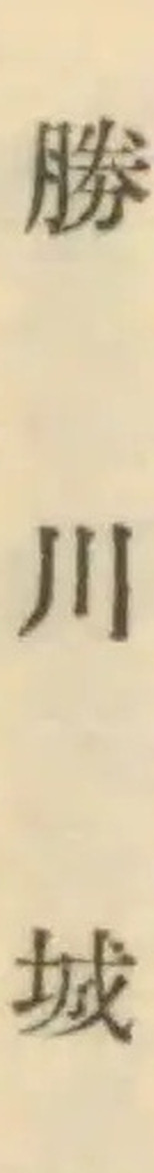勝川城
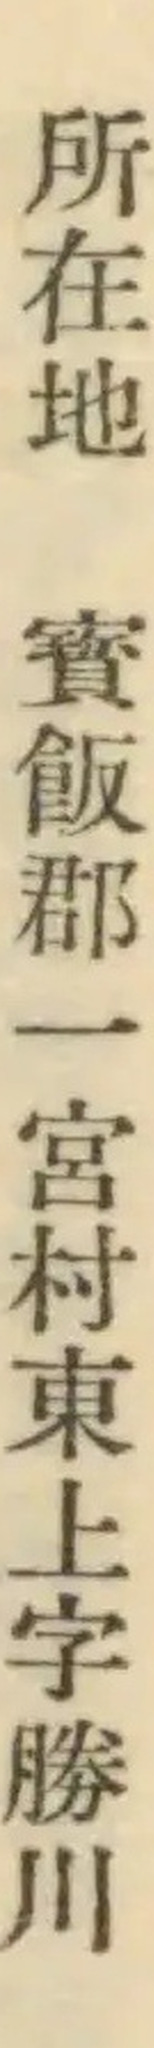所在地宝飯郡一宮村東上字勝川
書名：東三河之古城
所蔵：国立国会図書館 National Diet Library, JAPAN
